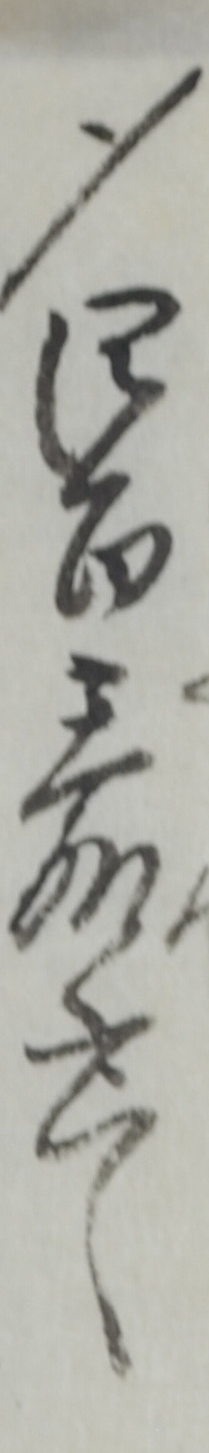〆四百三拾六文
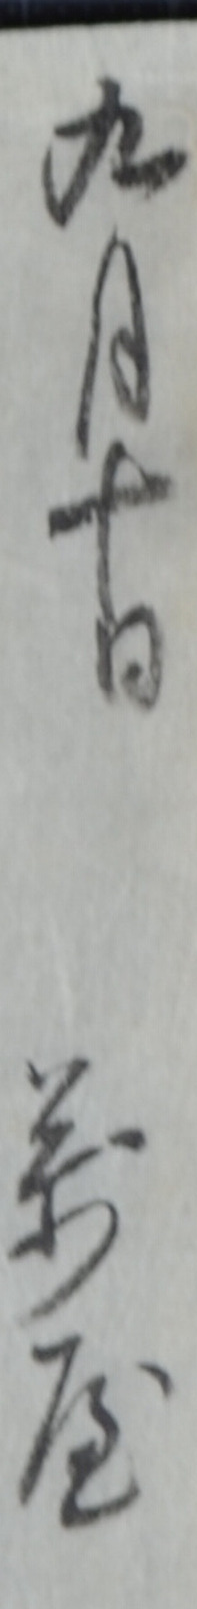九月朔日萬屋

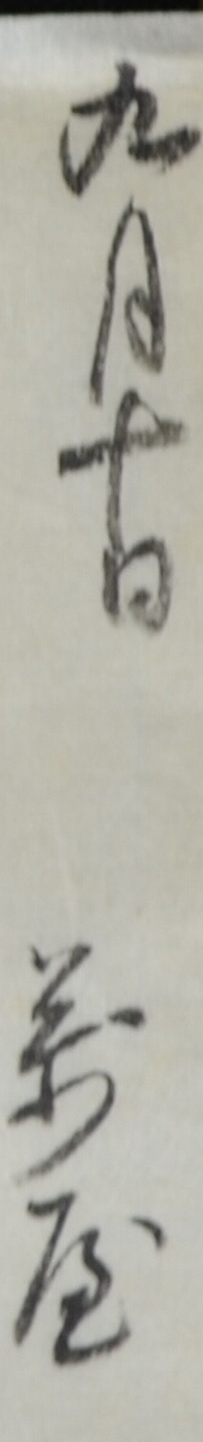九月十日萬屋
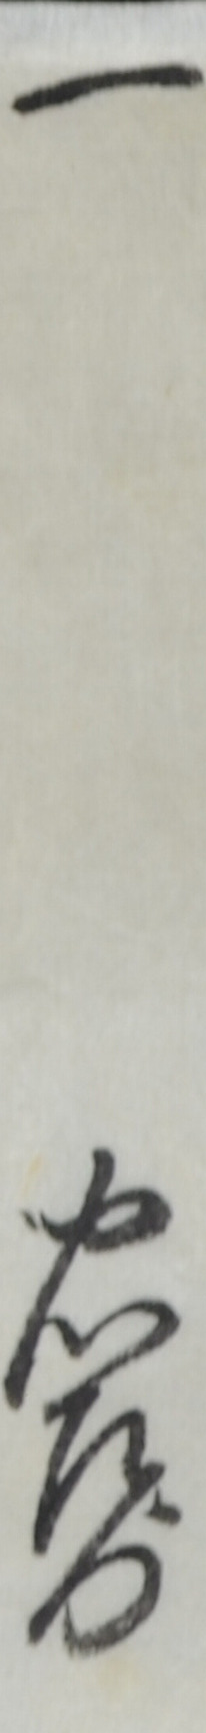一忠左衛門
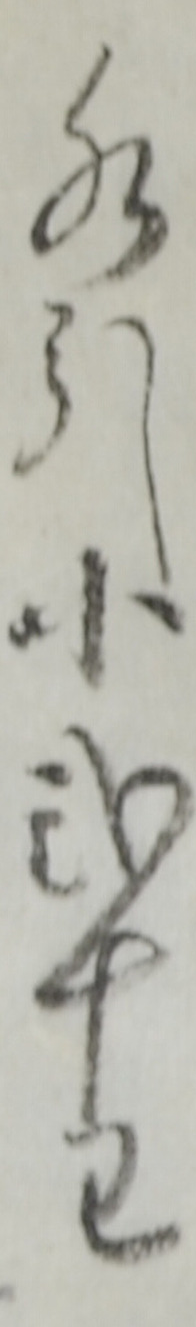水引小弐十わ
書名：権現勧化入用勘定帳
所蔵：伊那市立高遠町図書館・合同会社AMANE
